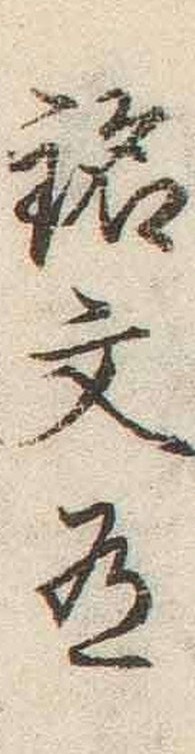銘文有
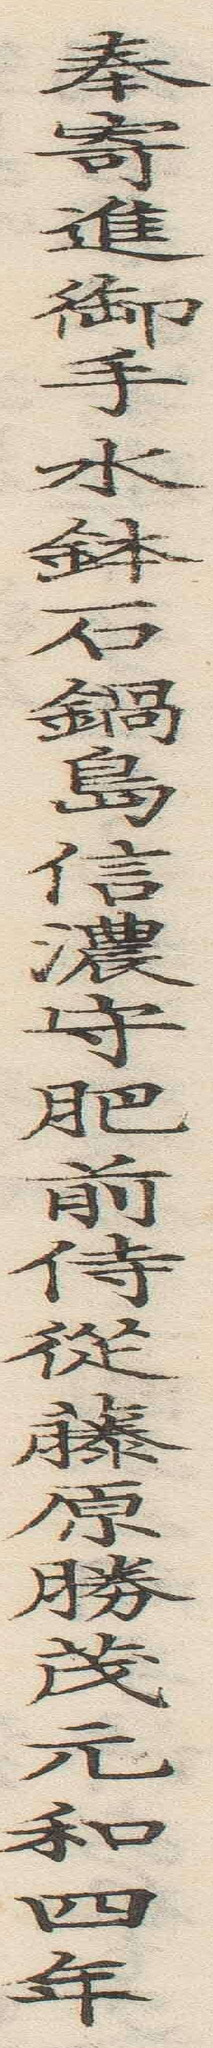奉寄進御手水鉢石鍋島信濃守肥前侍從藤原勝茂元和四年
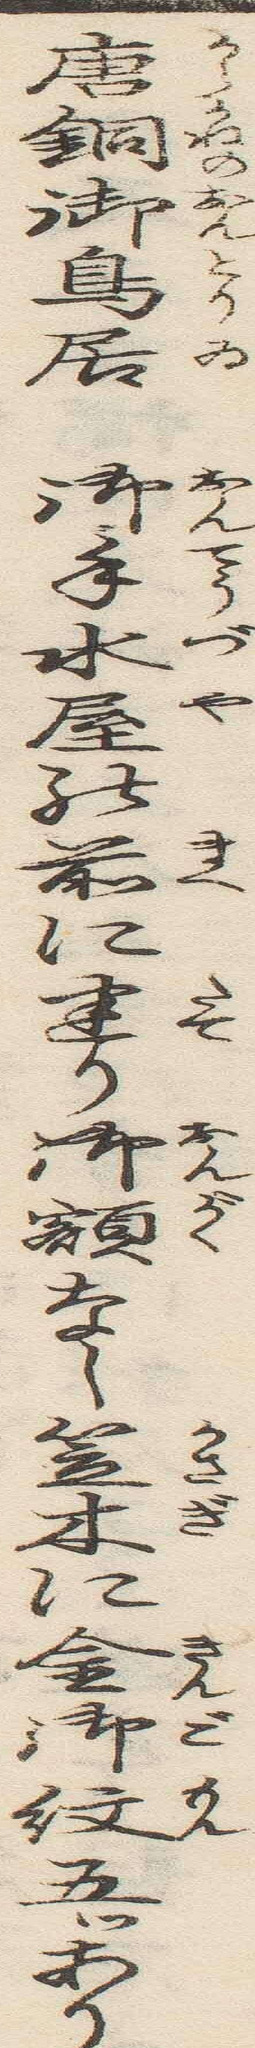唐銅御鳥居御手水屋の前に建り御額なし笠木に金御紋五ッあり
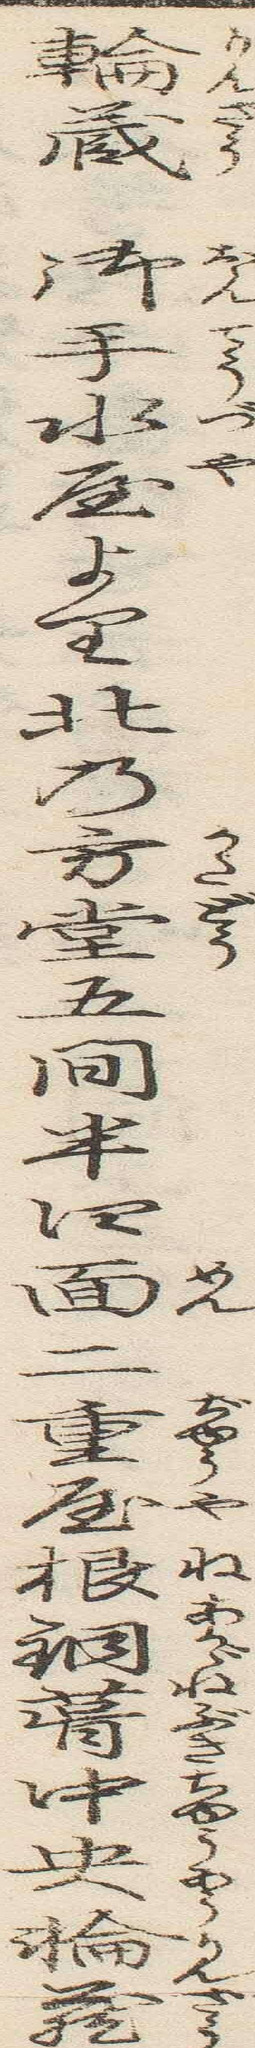輪蔵御手水屋より北の方堂五間半四面二重屋根銅葺中央輪蔵
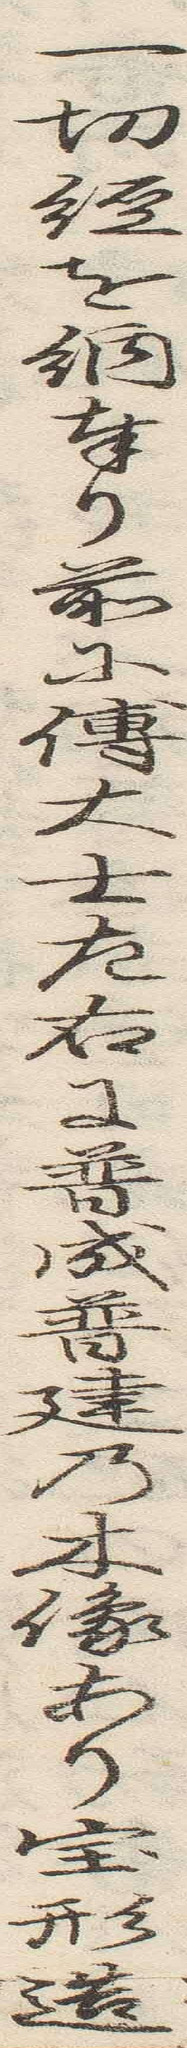一切經を納奉り前に傳大士左右に普成普建の木像あり宝形造
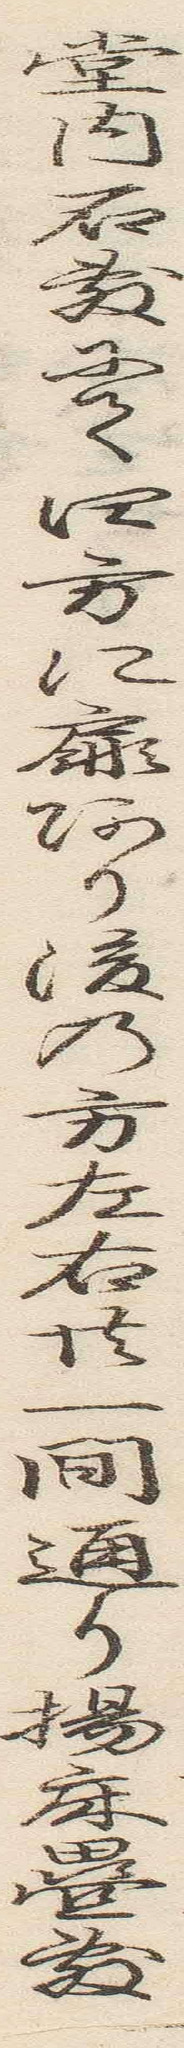堂内石敷にて四方に扉あり後の方左右共一間通り揚床疂敷
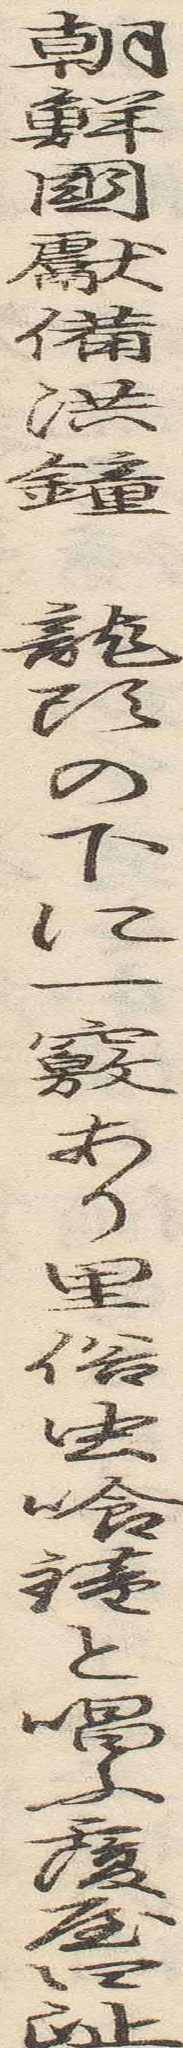朝鮮國獻備洪鐘龍頭の下に一竅あり里俗虫喰鐘と唱ふ覆屋四趾
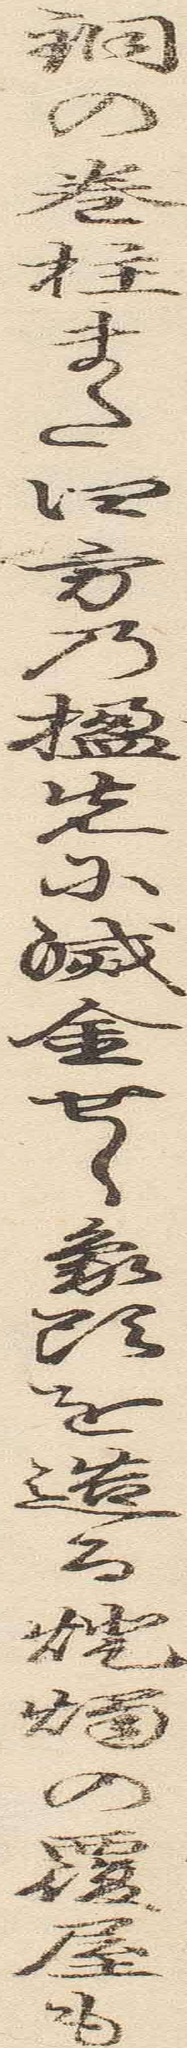銅の巻柱また四方の楹先に滅金せし象頭を造る燈燭の覆屋も
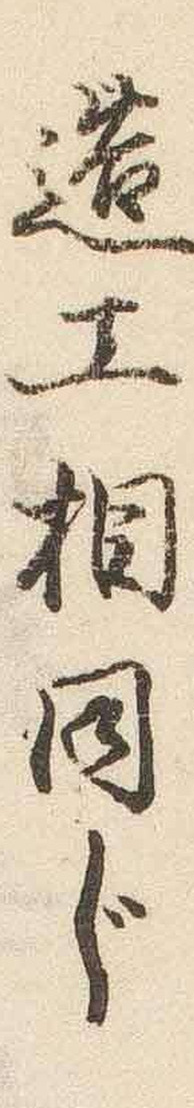造工相同じ
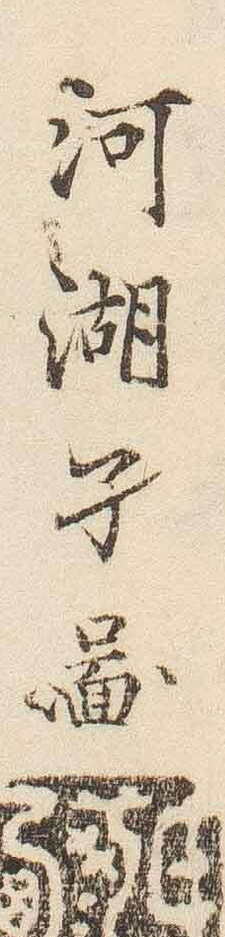河湖孑圖

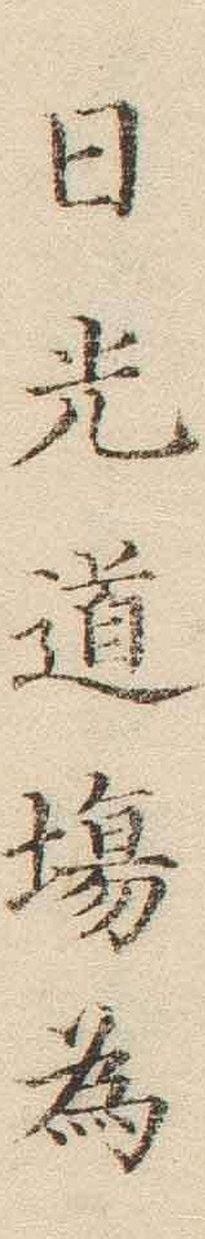日光道塲為
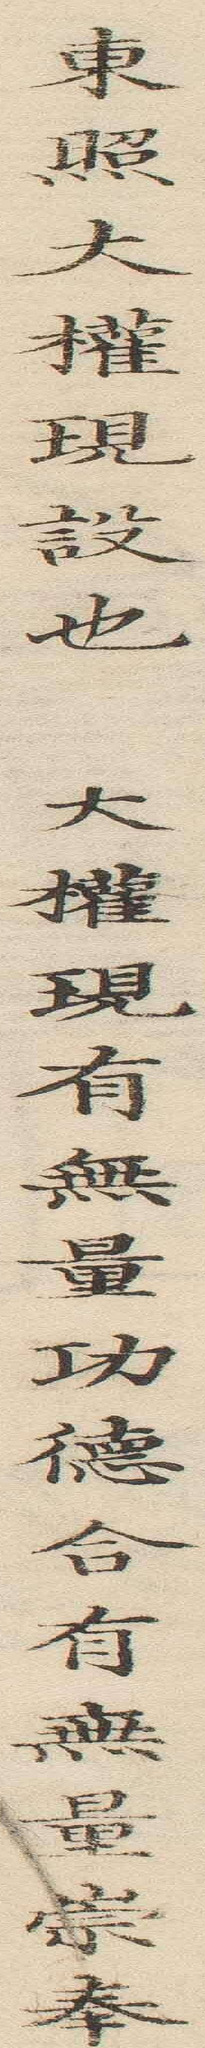東照大權現設也大權現有無量功德合有無量崇奉
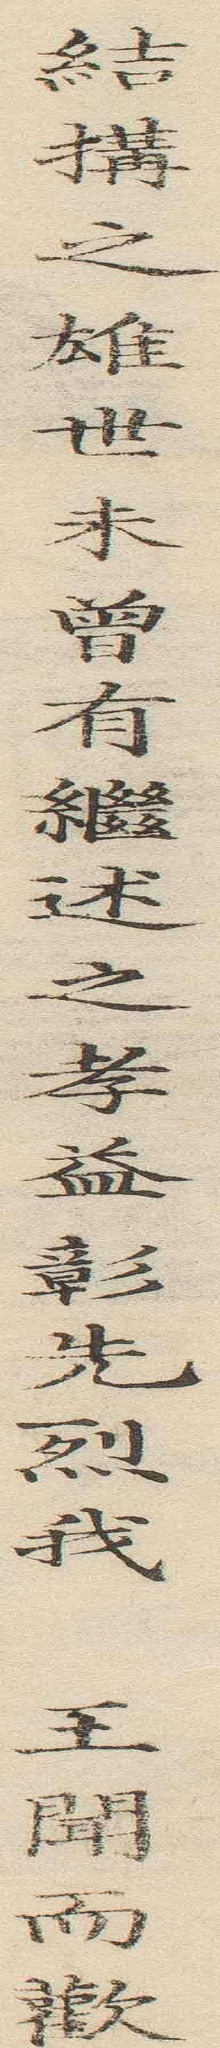結搆之雄世未曾有繼述之孝益彰先烈我王聞而歡
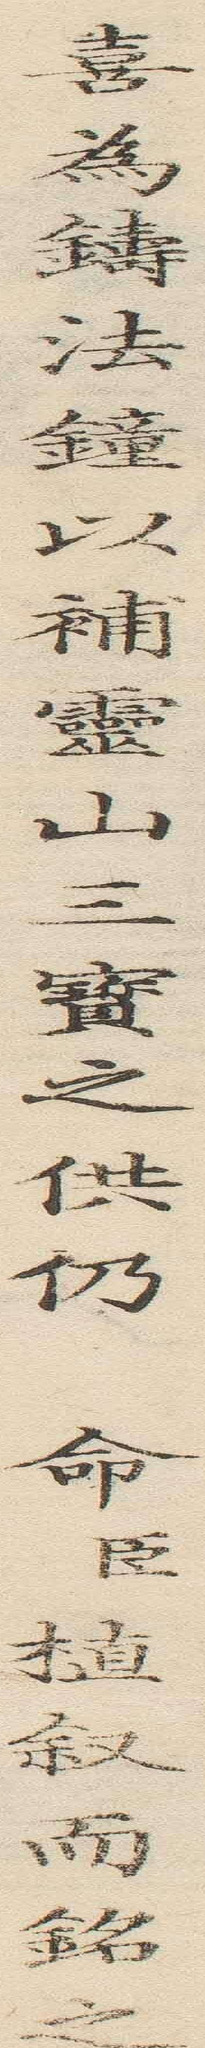喜為鑄法鐘以補靈山三寶之供仍命臣植叙而銘之
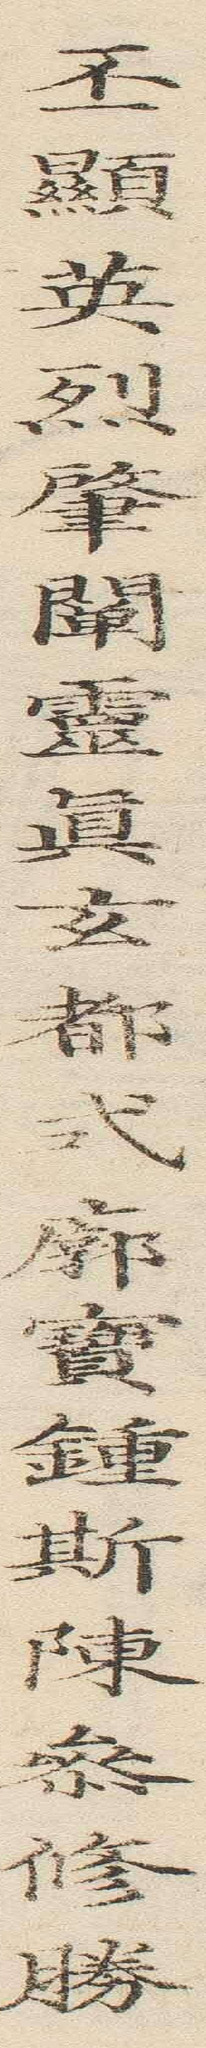丕顯英烈肇闡靈眞玄都式廓寶鐘斯陳叅修勝
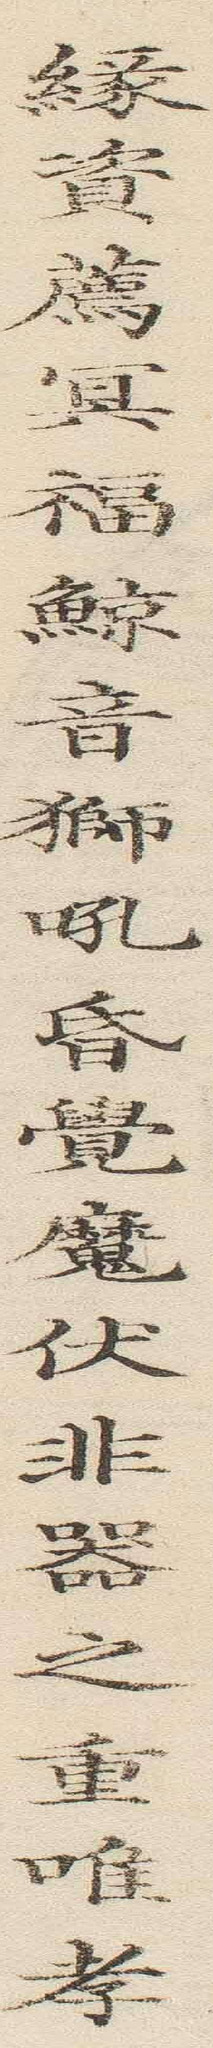緣資薦冥福鯨音獅吼昏覺魔伏非器之重唯孝
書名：日光山志
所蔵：東京学芸大学附属図書館 国文学研究資料館
